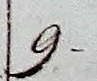9
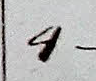4
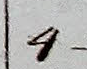4
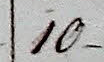10
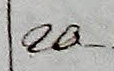20
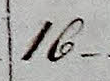16
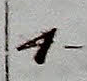4
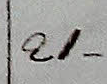21
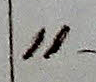11
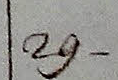29
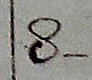8
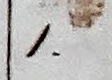1.
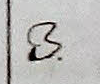3.
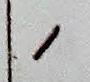1
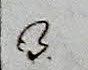3.
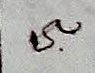5.
